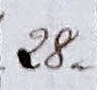28
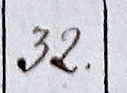32.
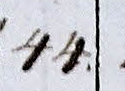44.
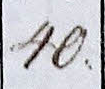40
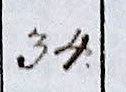34.
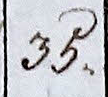35
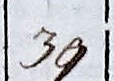39
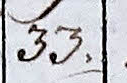33.
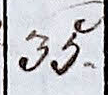35
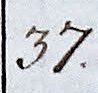37
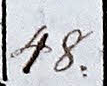48
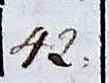42
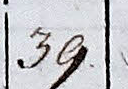39.
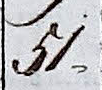51
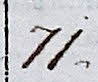71
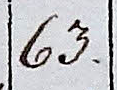63
